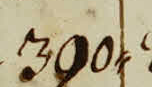390
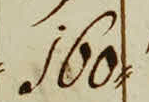160
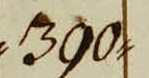390
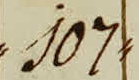107
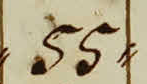55
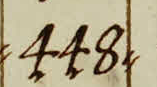448
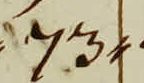73
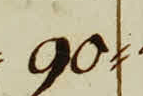90
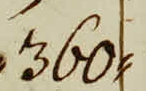360
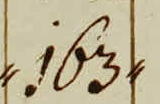163
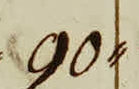90
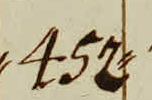452
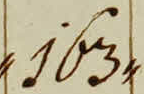163
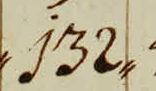132
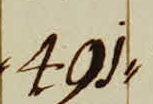491
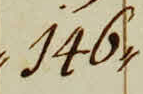146
